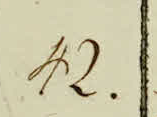42.
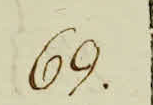69.
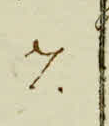7.
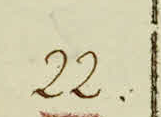22.
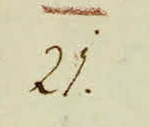21.
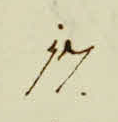17.
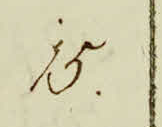15.
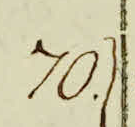70.
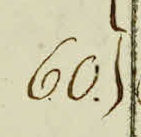60.
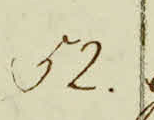52.
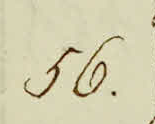56.
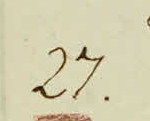27.
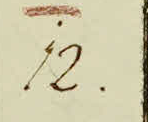12.
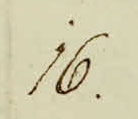16.
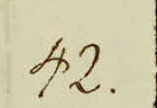42.
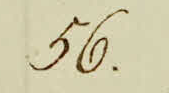56.
